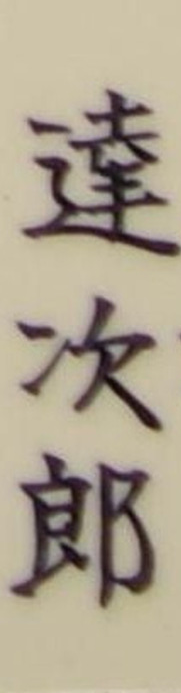達次郎
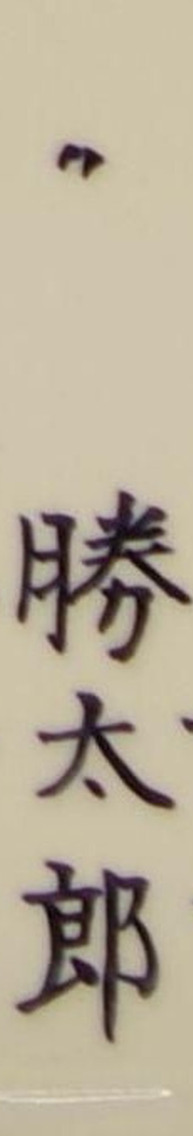勝太郎
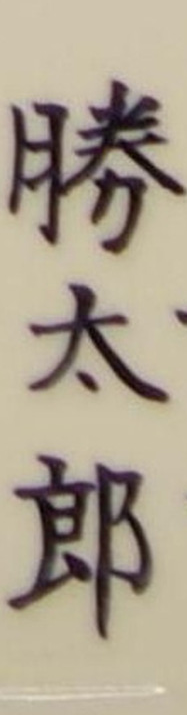勝太郎
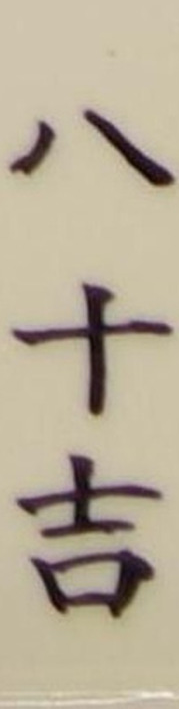八十吉
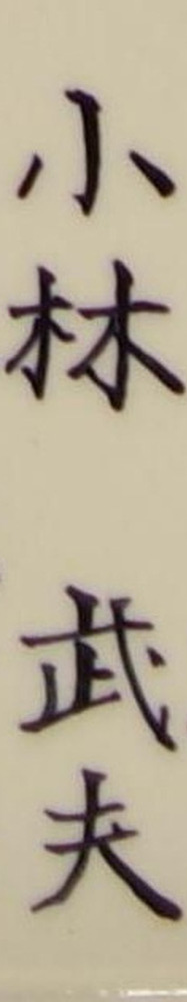小林武夫
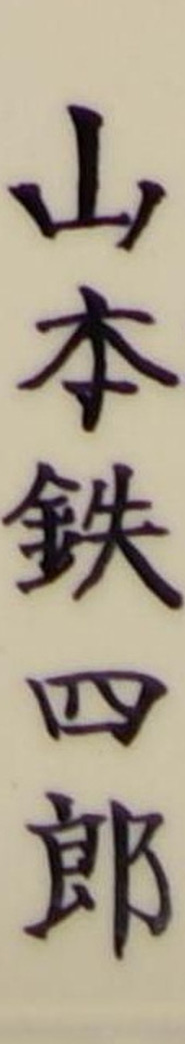山本鉄四郎
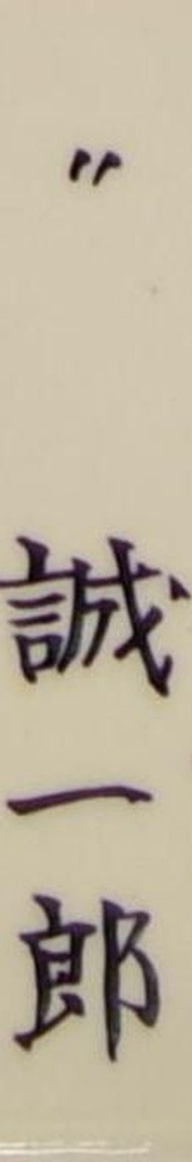誠一郎
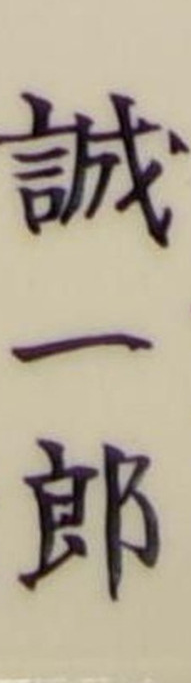誠一郎
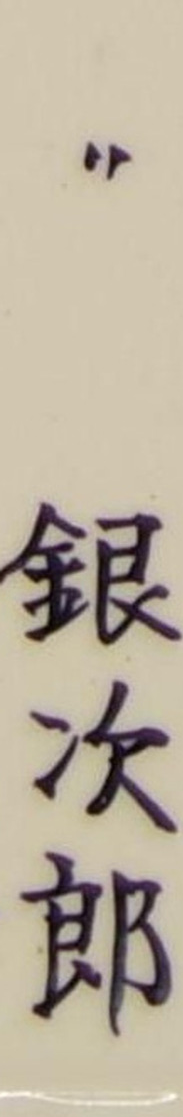銀次郎
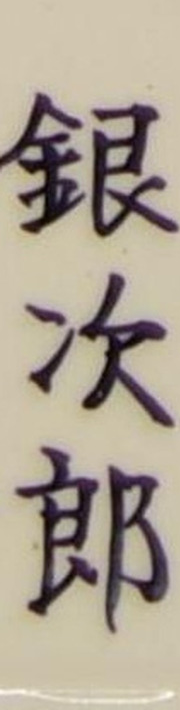銀次郎
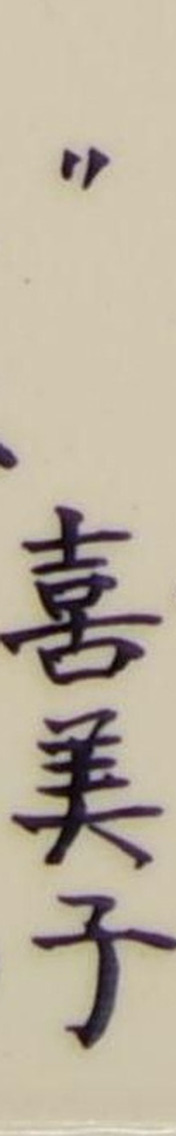喜美子
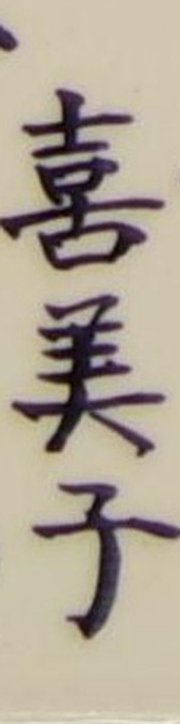喜美子
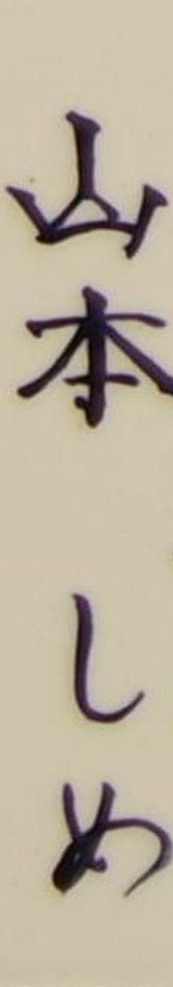山本しめ

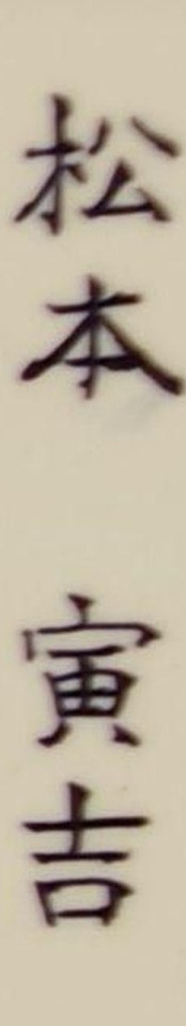松本寅吉
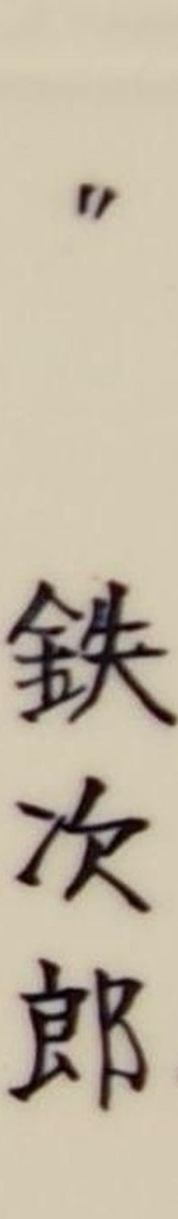鉄次郎
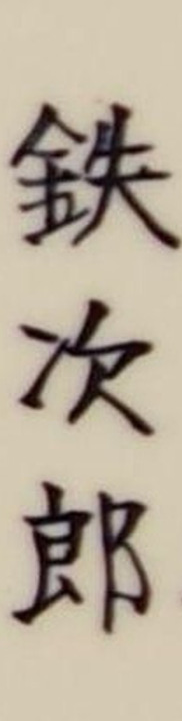鉄次郎
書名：A~D
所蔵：koyasan kongobuji
